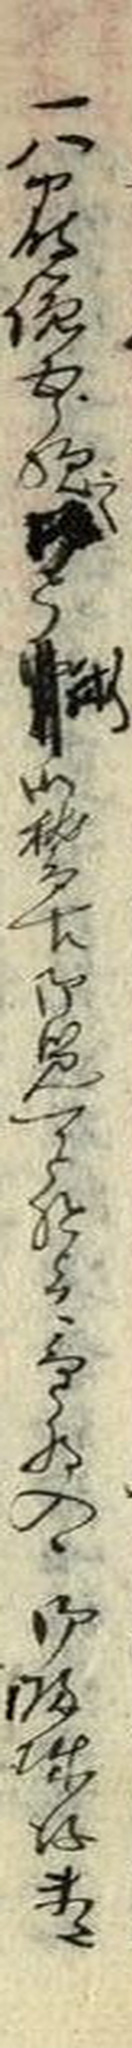一八半時謙五郎様之御弓術御稽古御覧可被遊旨ニ而被為入候御帰城後未た
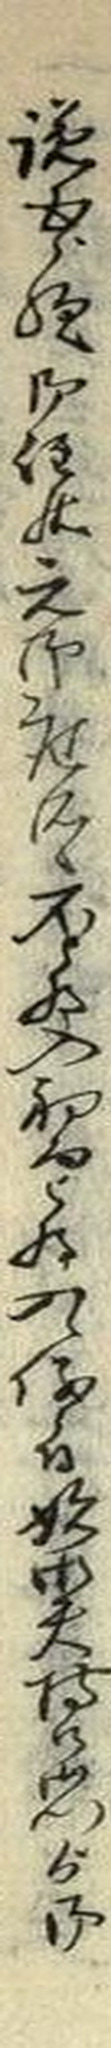謙五郎様御住居元御座所へ不被為入初而被為入候儀ニ付始御矢場口御門ゟ御
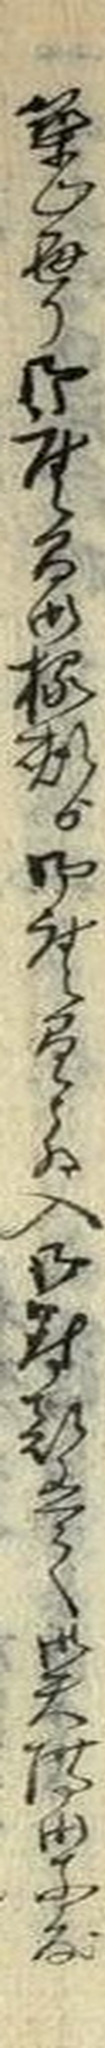築山通り御座之間御縁頬ゟ御座之間へ被為入御対顔有之御矢場御支度
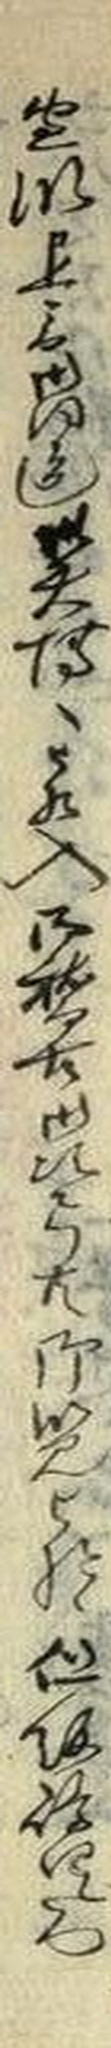宜段申上ニ而御同道御矢場へ被為入御稽古御次弓共御覧被遊候但飯嶋四郎右衛門
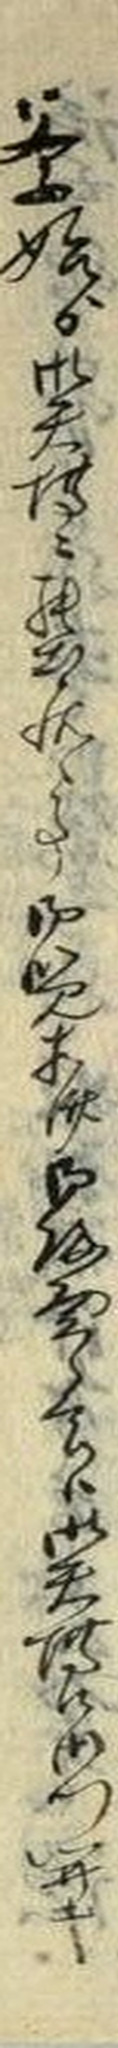ハ索始ゟ御矢場ニ罷出居候事御覧相済御帰殿之節ハ御矢場口御門開キ

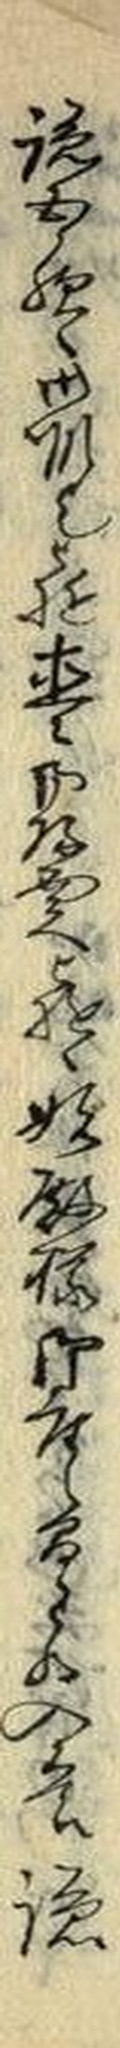謙五郎様へ御暇乞被遊直ニ御帰殿被遊候始殿様御座之間へ被為入候節謙
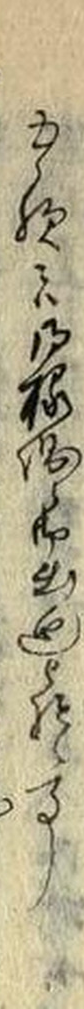五郎様ニハ御縁側ニ御出迎被遊候事
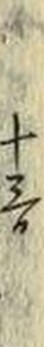十三日
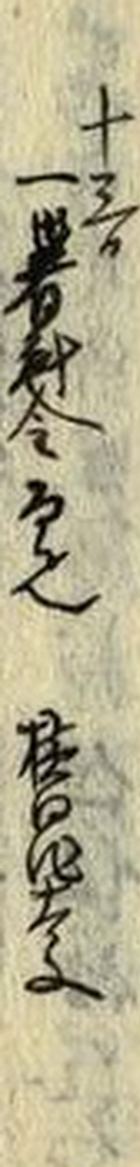一御肴料金百疋横田作太夫
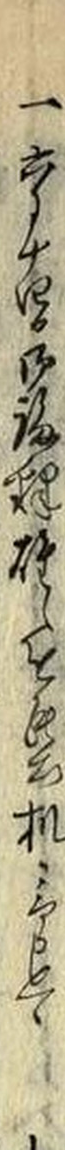一六月十四日御講釈雄之進罷出机ニ而申上候
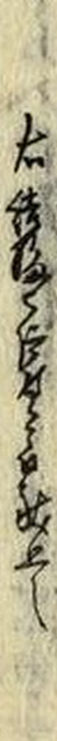右結構被仰付候ニ付献上之
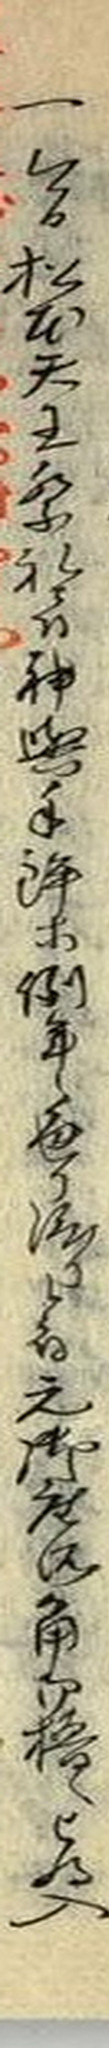一今日松本天王祭礼ニ付神輿手鉾等例年之通り渡り候ニ付元御座所角御櫓へ被為入
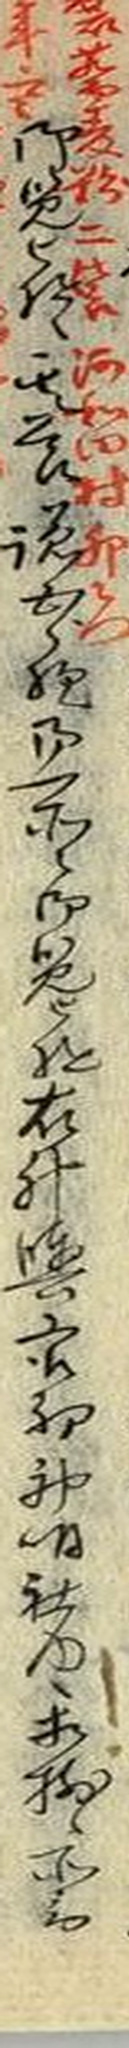御覧被遊候其節謙五郎様御一所ニ御覧被遊右神輿最初神明社内へ相揃候所ニ而
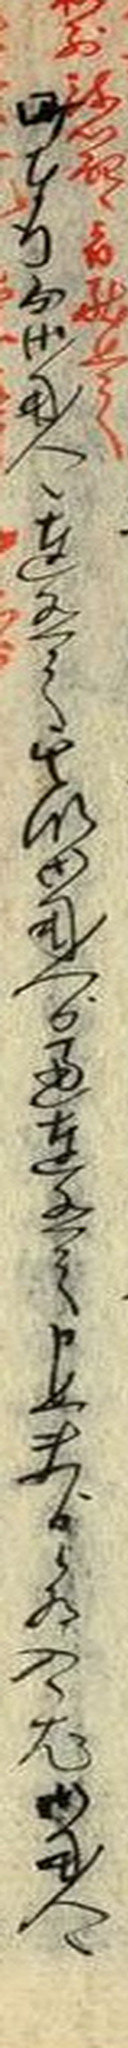町奉行ゟ御用人へ達有之其段御用人ゟ通達有之申上夫ゟ被為入候尤御用人へ
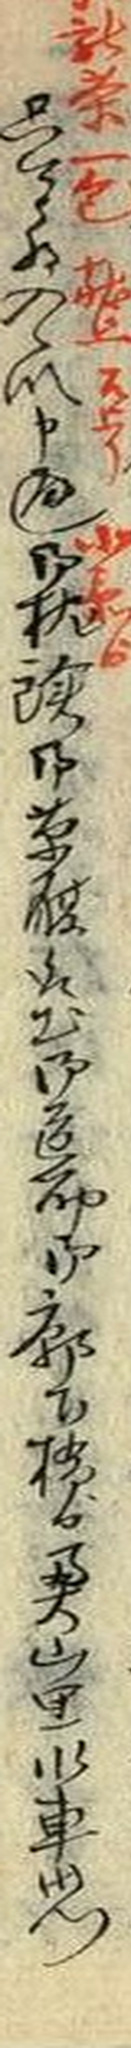只今被為入候段申通御枕鎗御草履取出御道筋御廊下橋ゟ奥山里水車御門
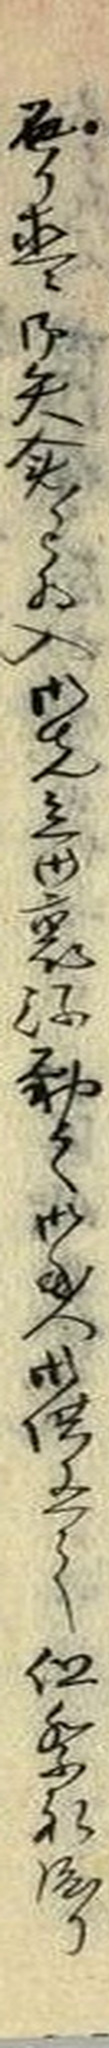通り直ニ御矢倉へ被為入御先立御裏役勤之御用人御供有之但祭礼渡り
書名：少傅日録抄（斉承付側向頭取日記、在国）
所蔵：福井県文書館 Fukui Prefectural Archives
